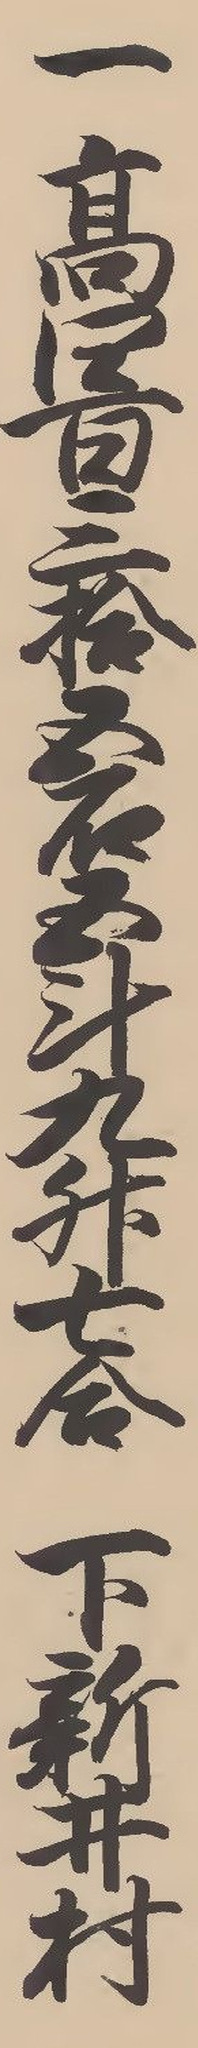一高四百三拾五石五斗九升七合下新井村
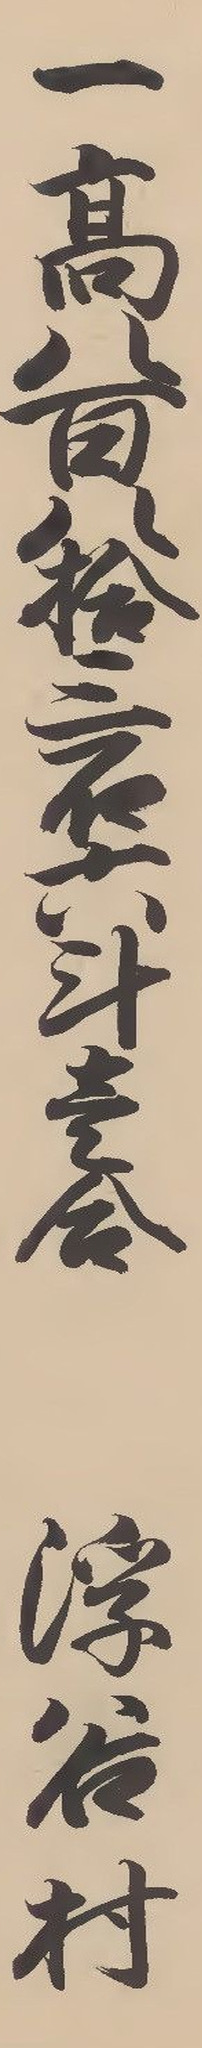一高八百八拾三石六斗壱合浮谷村
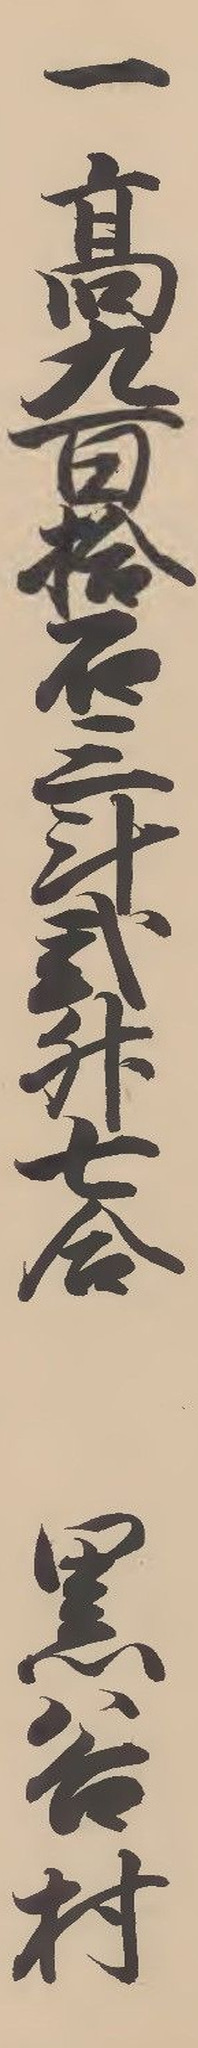一高九百拾石三斗弐升七合黒谷村
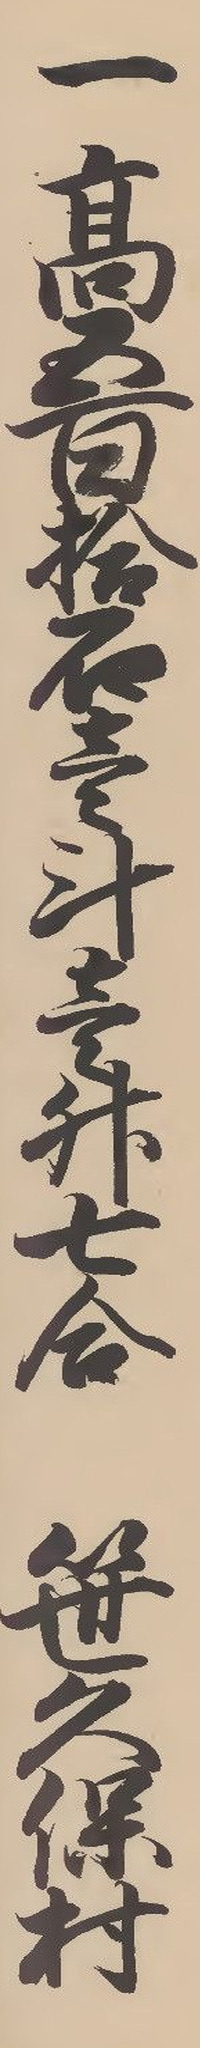一高五百拾石壱斗壱升七合笹久保村
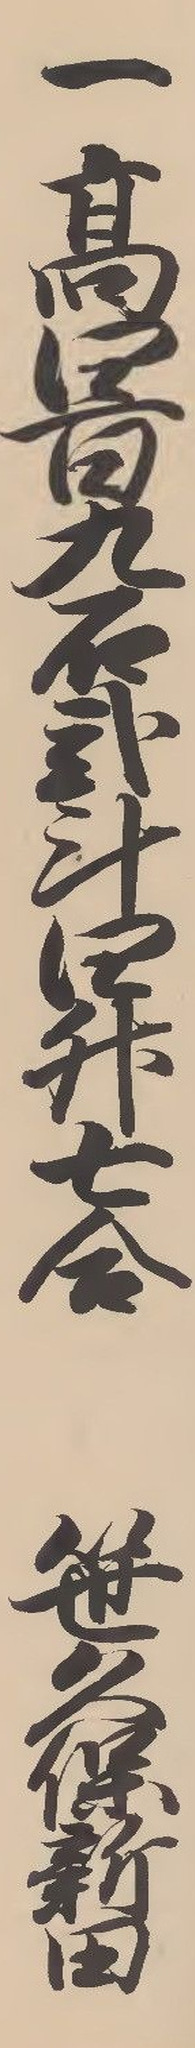一高四百九石弐斗四升七合笹久保新田
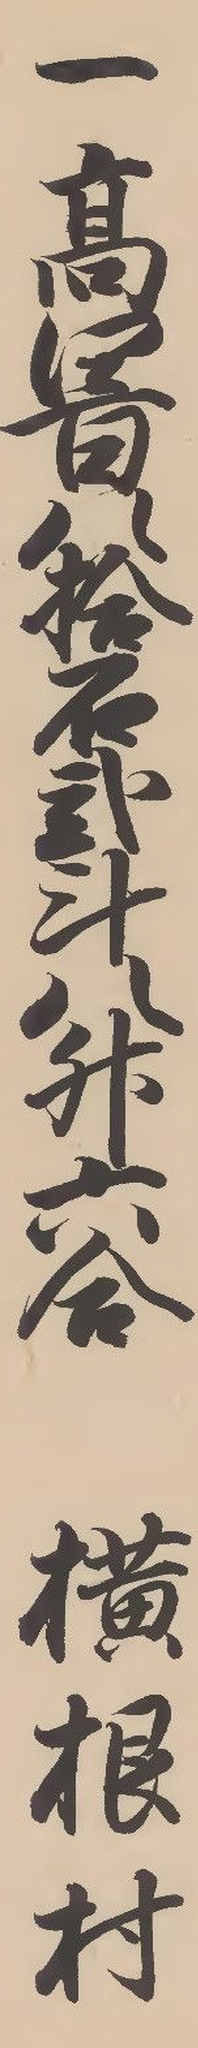一高四百八拾石弐斗八升六合横根村
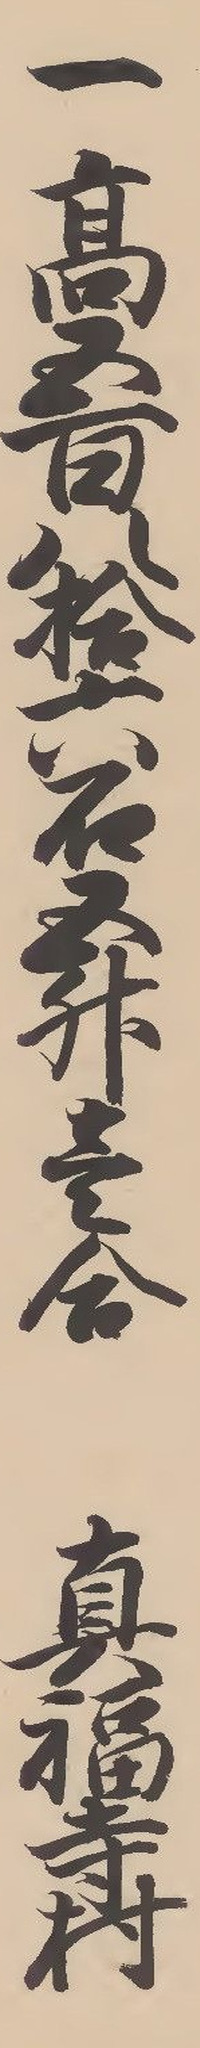一高五百八拾六石五升壱合真福寺村
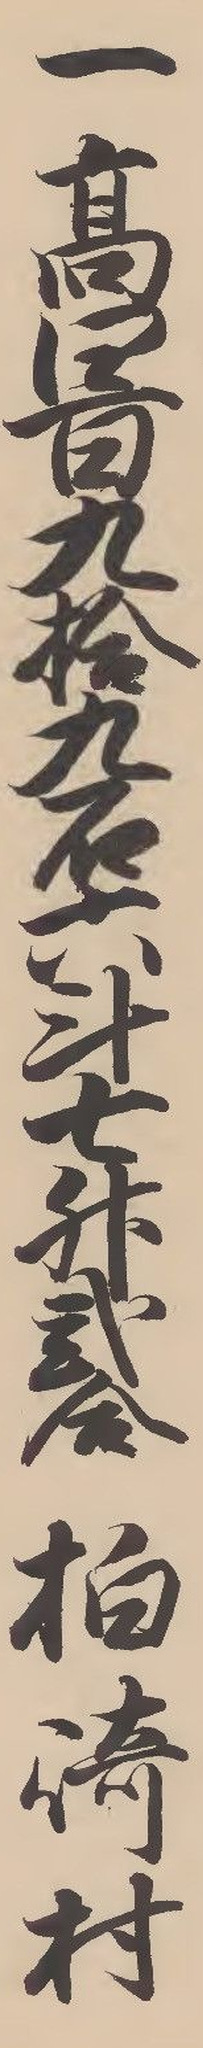一高四百九拾九石六斗七升弐合柏崎村

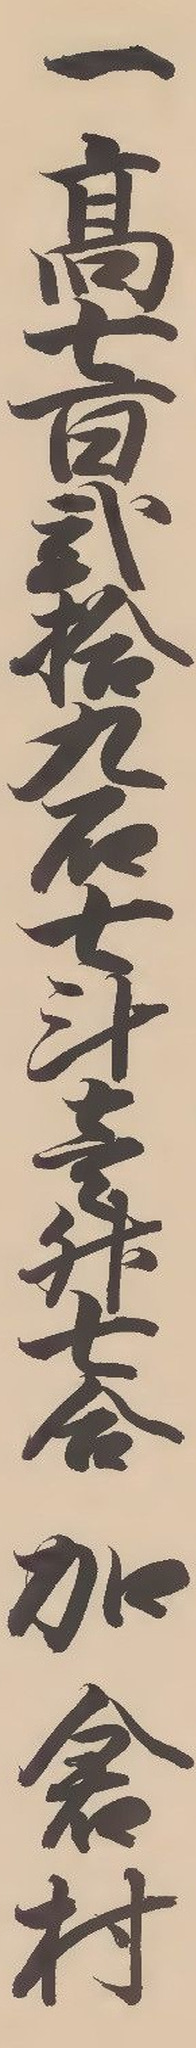一高七百弐拾九石七斗壱升七合加倉村
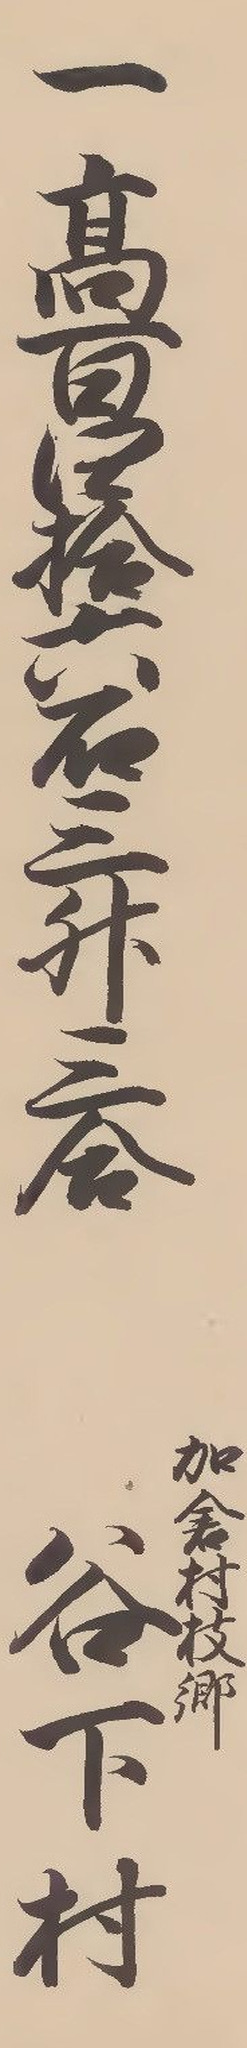一高百四拾六石三升三合谷下村
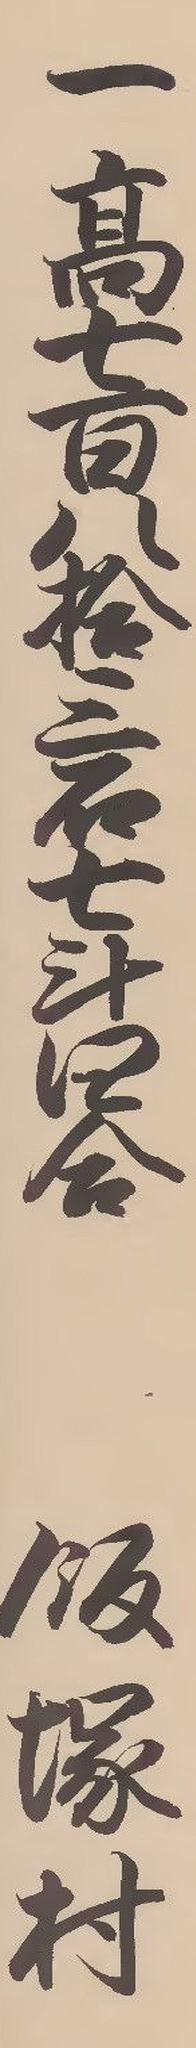一高七百八拾三石七斗四合飯塚村
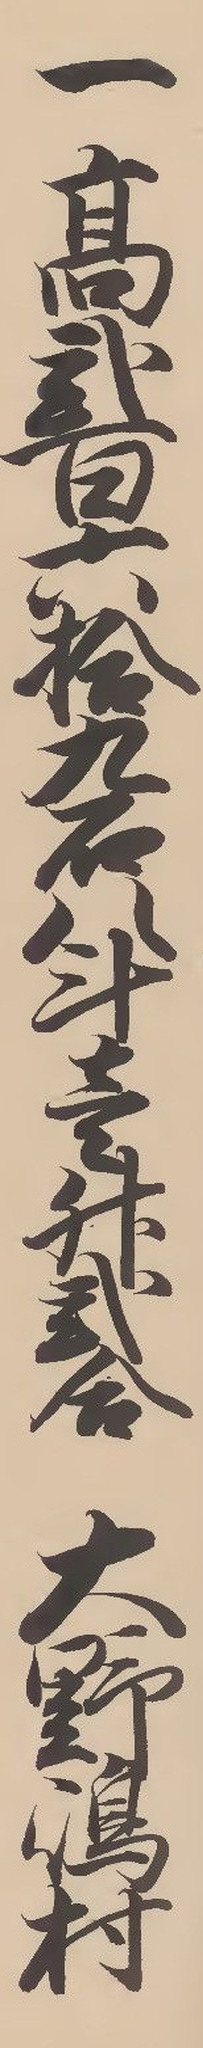一高弐百六拾九石八斗壱升弐合大野嶋村
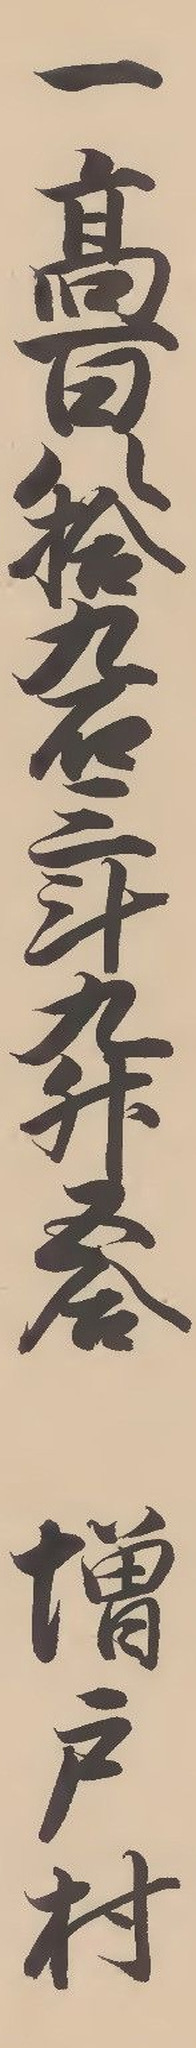一高百八拾九石三斗九升五合増戸村
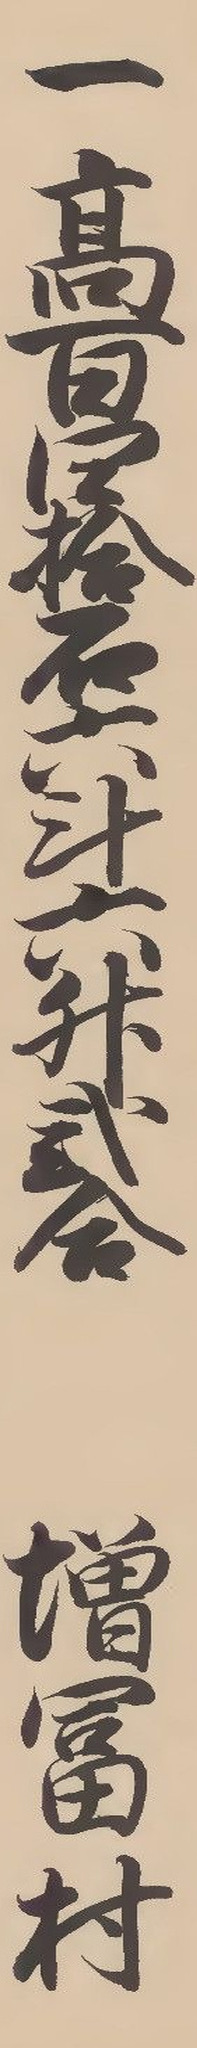一高百四拾石六斗六升弐合増冨村
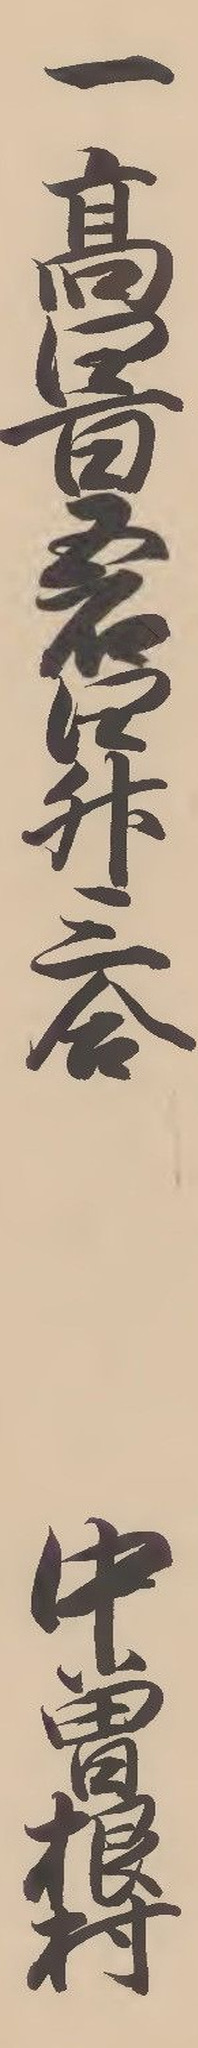一高四百五石四升三合中曽根村

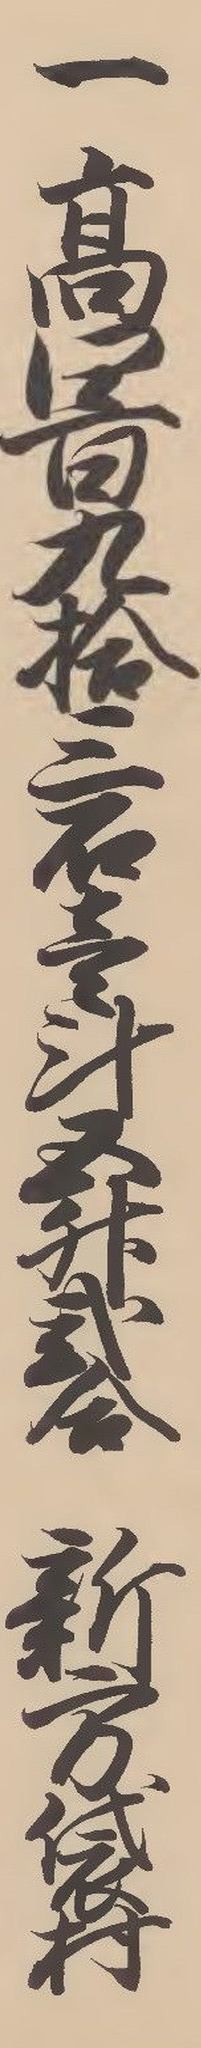一高四百九拾三石壱斗五升弐合新方袋村
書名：武蔵国郷帳　下
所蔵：国立公文書館 National Archives of Japan
